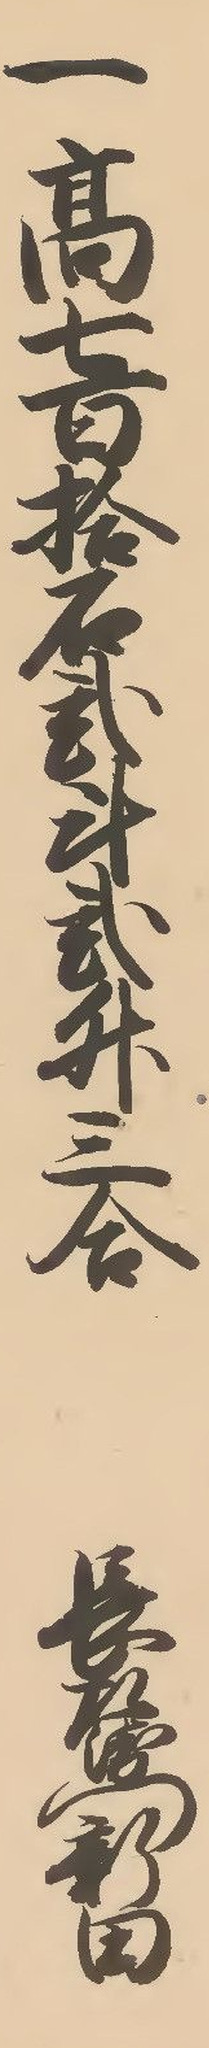一高七百拾石弐斗弐升三合長左衛門新田
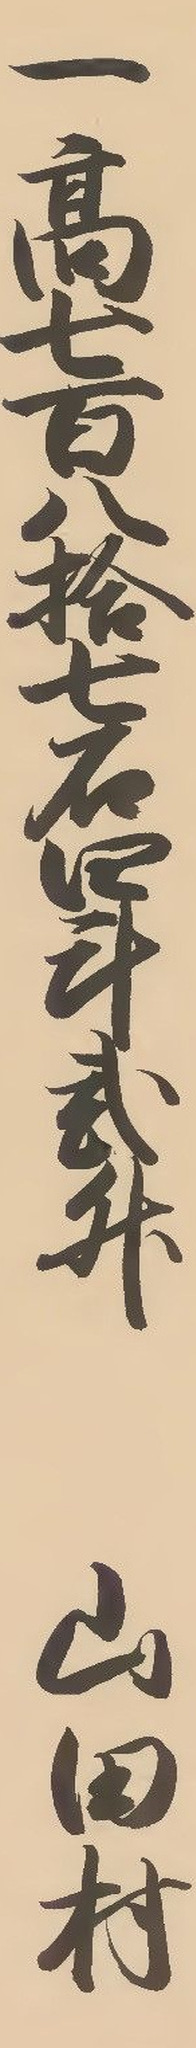一高七百八拾七石四斗弐升山田村
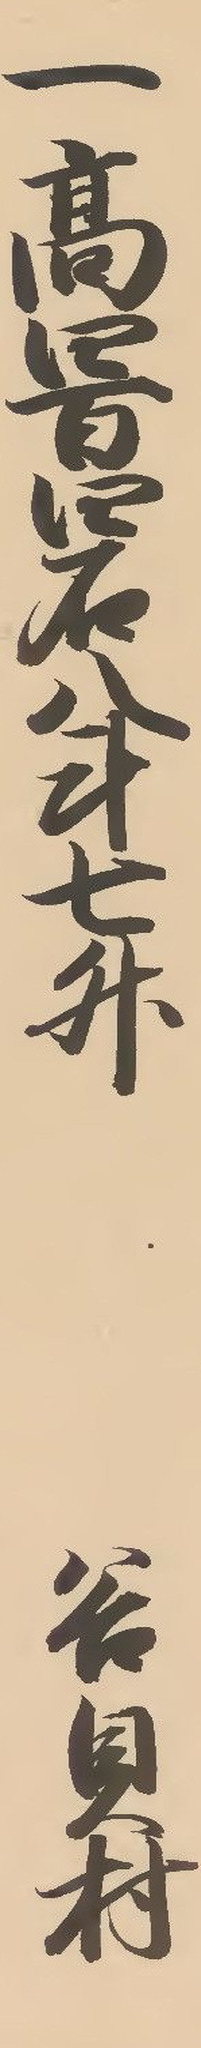一高四百四石八斗七升谷貝村
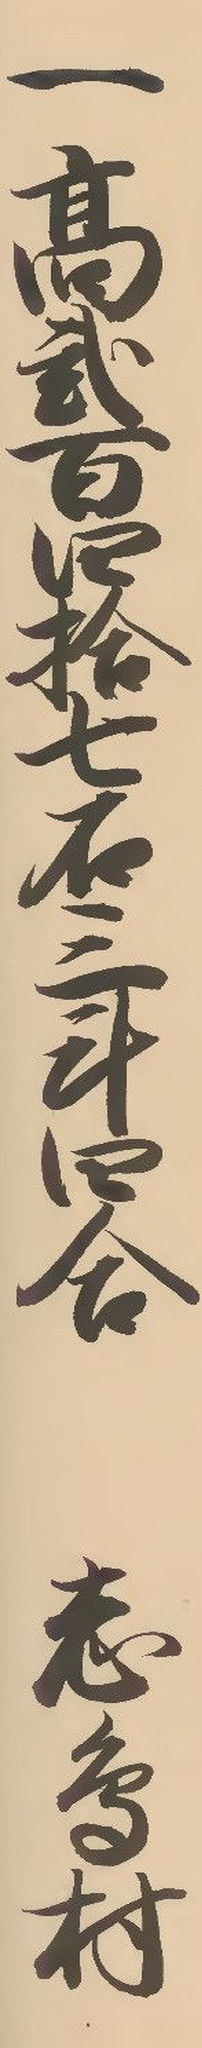一高弐百四拾七石三斗四合志鳥村
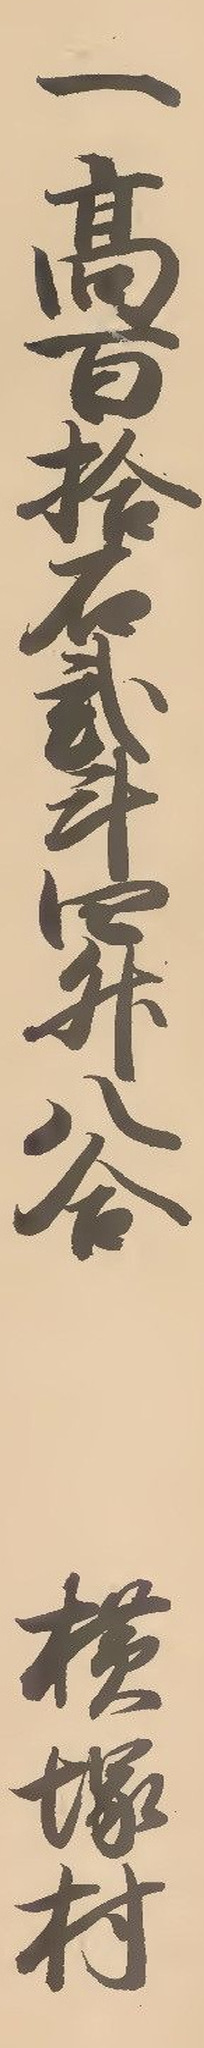一高百拾石弐斗四升八合横塚村
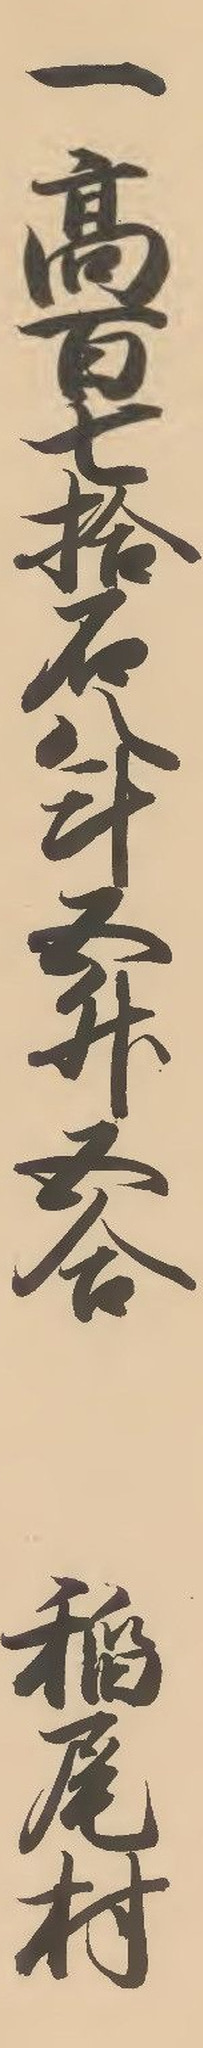一高百七拾石八斗五升五合稲尾村
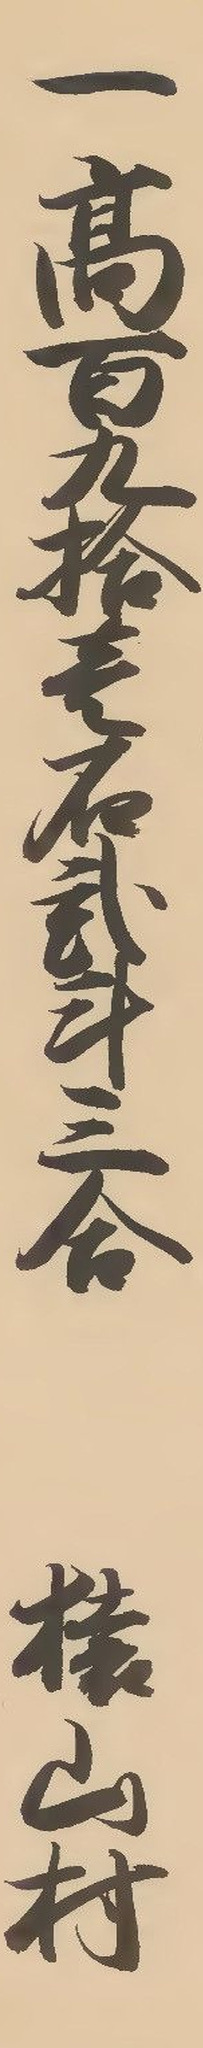一高百九拾壱石弐斗三合猿山村
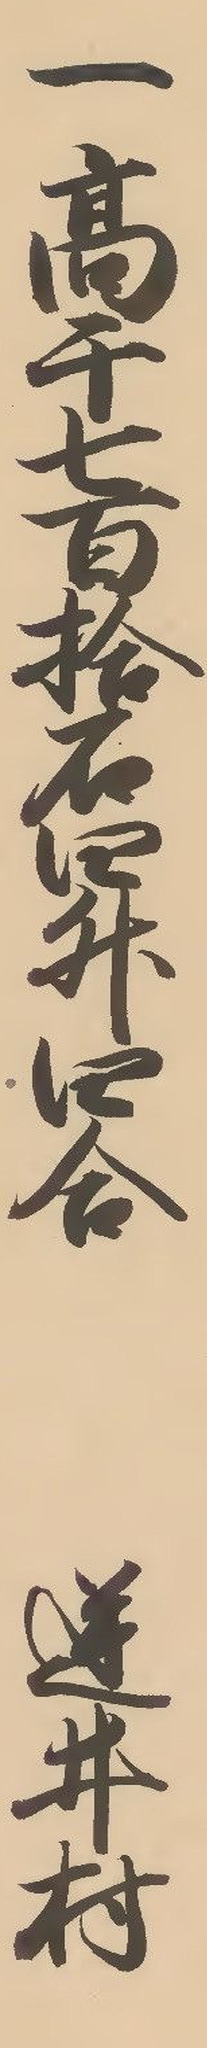一高千七百拾石四升四合逆井村

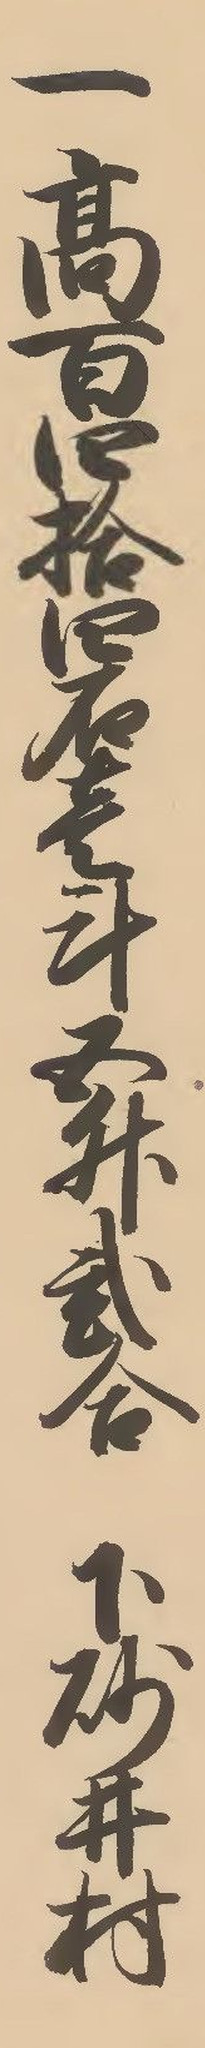一高百四拾四石壱斗五升弐合下砂井村
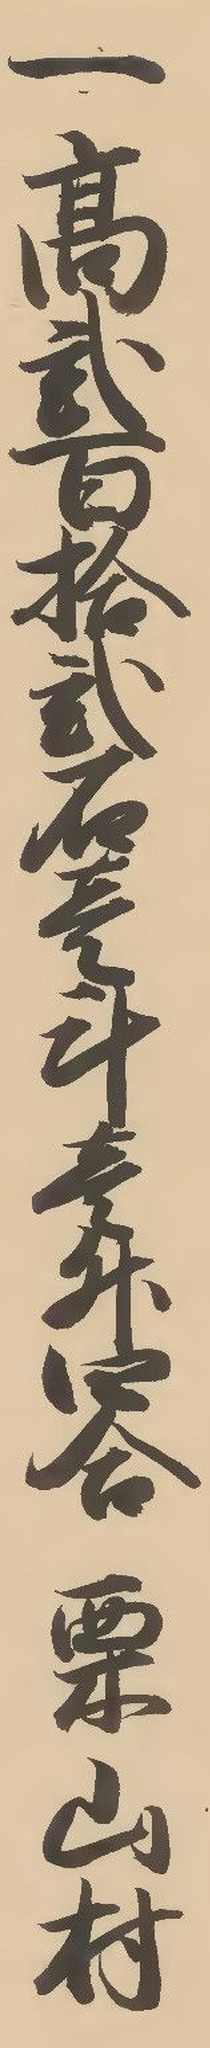一高弐百拾弐石壱斗壱升四合栗山村
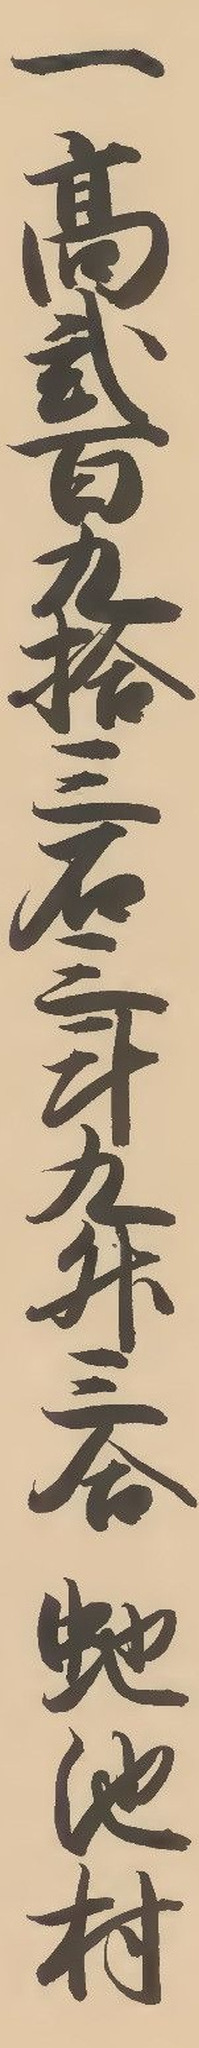一高弐百九拾三石三斗九升三合蛇池村
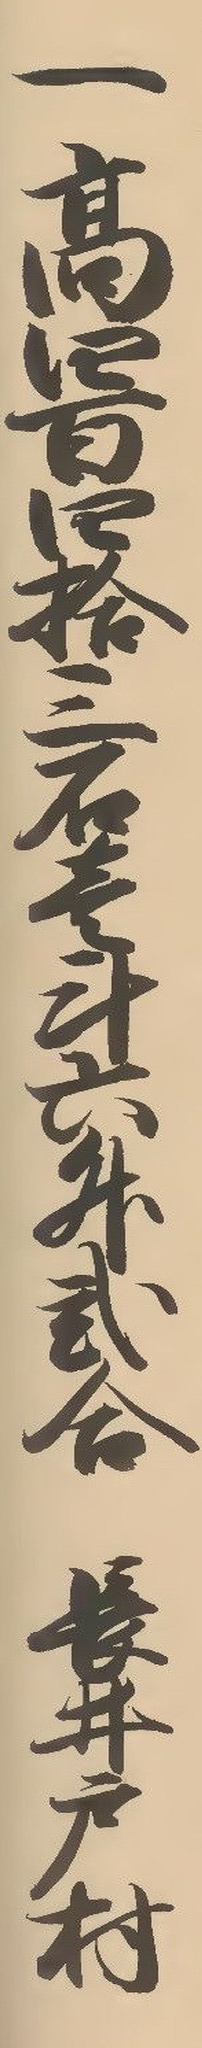一高四百四拾三石壱斗六升弐合長井戸村
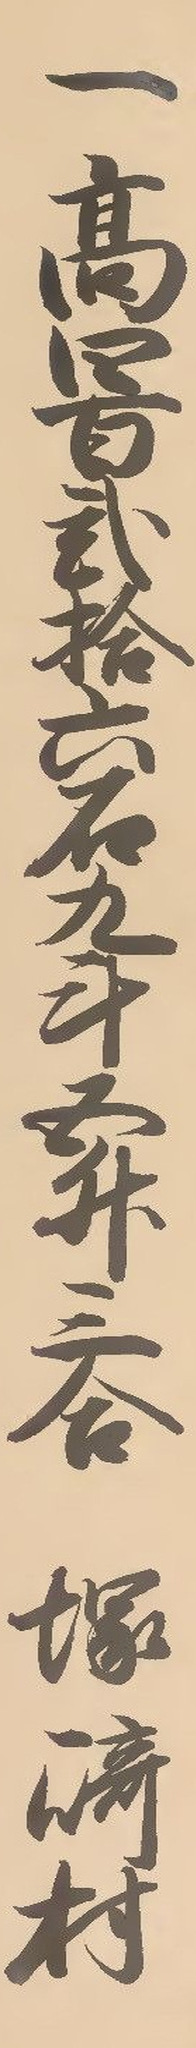一高四百弐拾六石九斗五升三合塚崎村
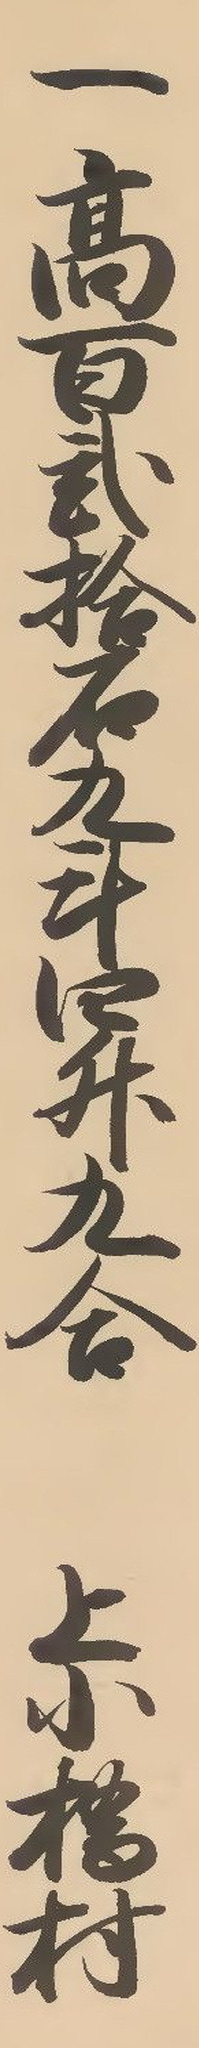一高百弐拾石九斗四升九合上小橋村
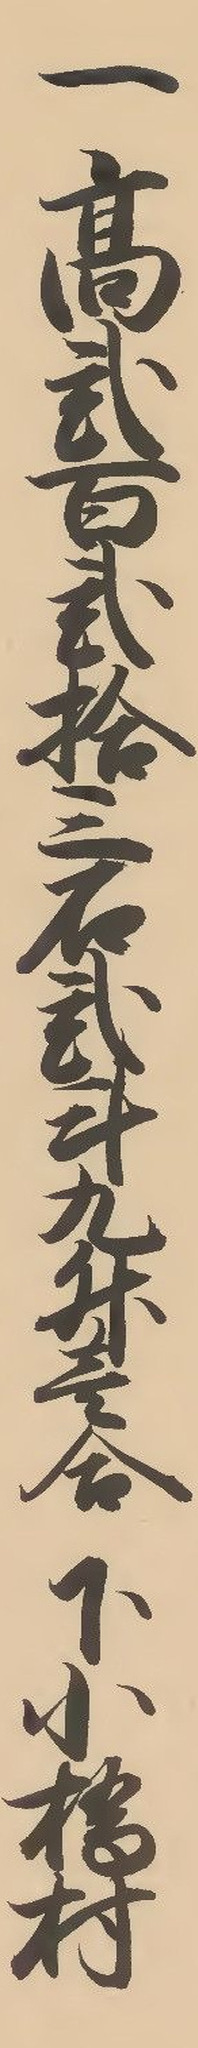一高弐百弐拾三石弐斗九升壱合下小橋村
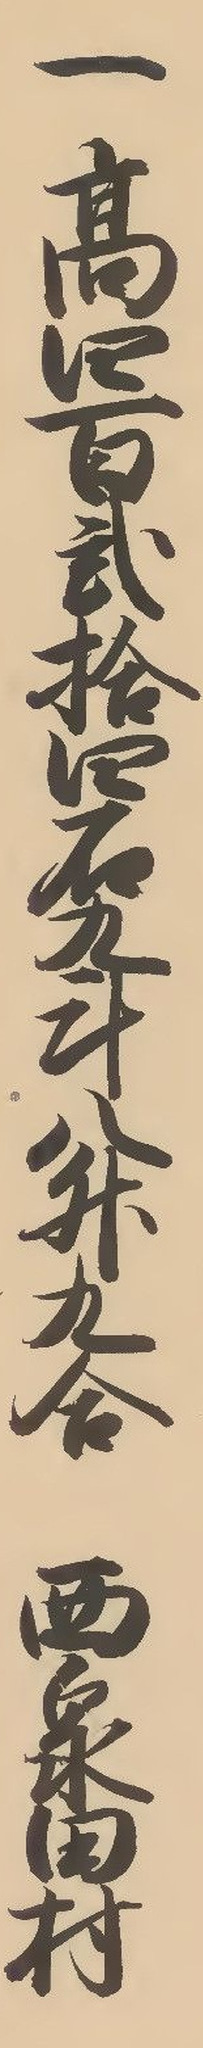一高四百弐拾四石九斗八升九合西泉田村
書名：下総国郷帳
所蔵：国立公文書館 National Archives of Japan
